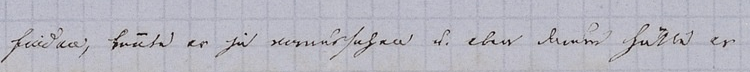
finden, könnte er ja voraussehen u. eben darum hätte er
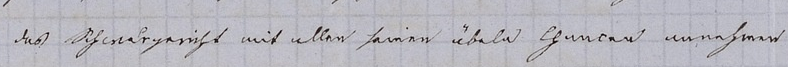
das Schwurgericht mit allen seinen übeln Chancen annehmen
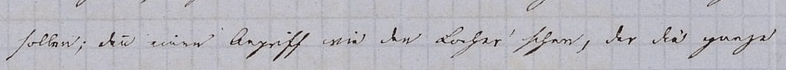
sollen; denn einen Angriff wie den Locher'schen, der die ganze
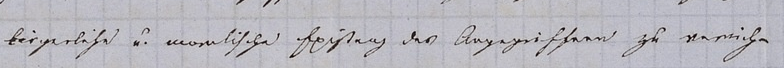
bürgerliche u. moralische Existenz des Angegriffnen zu vernich-
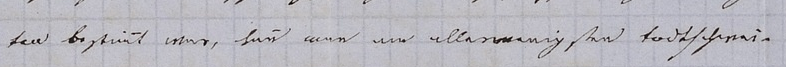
ten bestimmt war, kann man am allerwenigsten todtschwei-
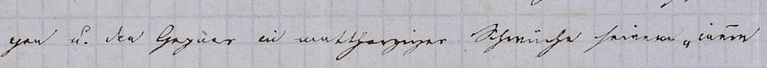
gen u. den Gegner mit mattherziger Schwäche seinem «innern
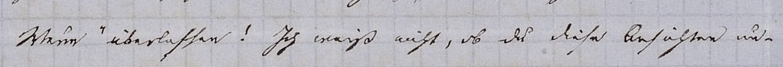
Wurm» überlassen! Ich weiß nicht, ob Du diese Ansichten un-
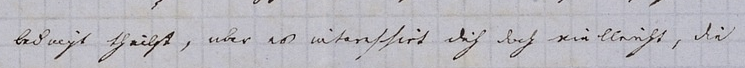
bedingt theilst, aber es interessirt Dich doch vielleicht, die
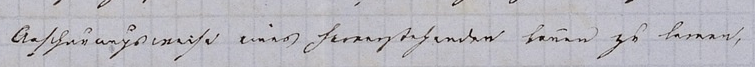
Anschauungsweise eines Fernerstehenden kennen zu lernen,
